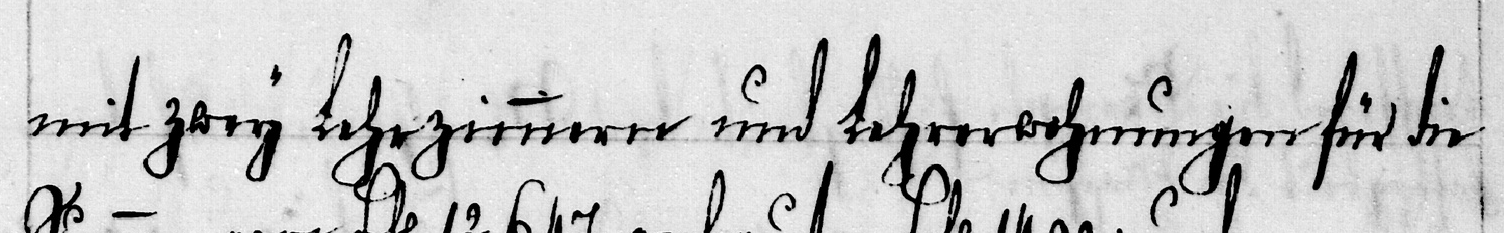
mit zwey Lehrzimmern und Lehrerwohnungen für die
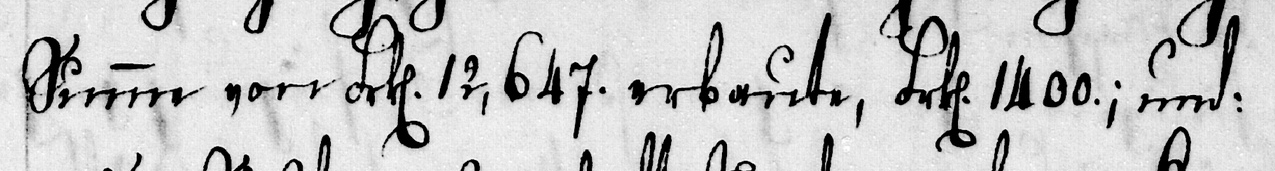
Summe von Frk[en]. 12'647. erbaute, Frk[en]. 1400.; und:
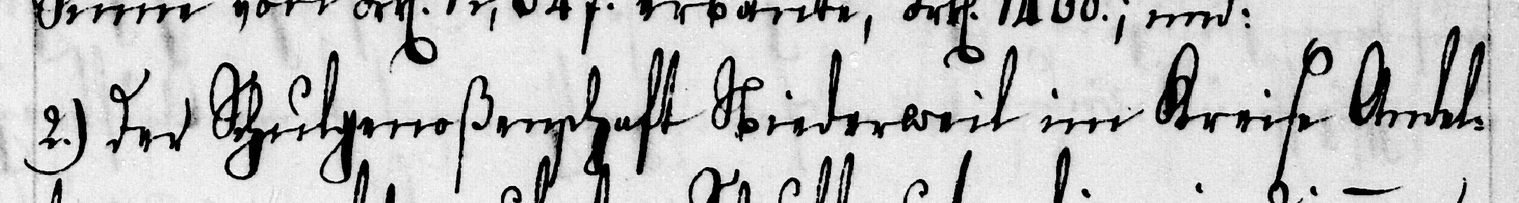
2.) Der Schulgenoßenschaft Niederweil im Kreise Andel¬
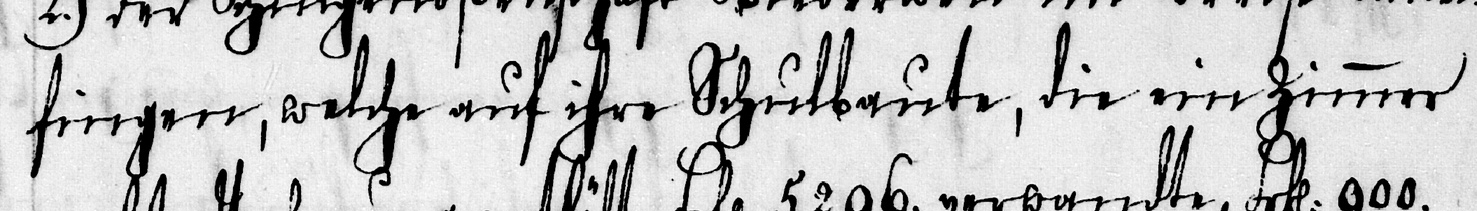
fingen, welche auf ihre Schulbaute, die ein Zimmer
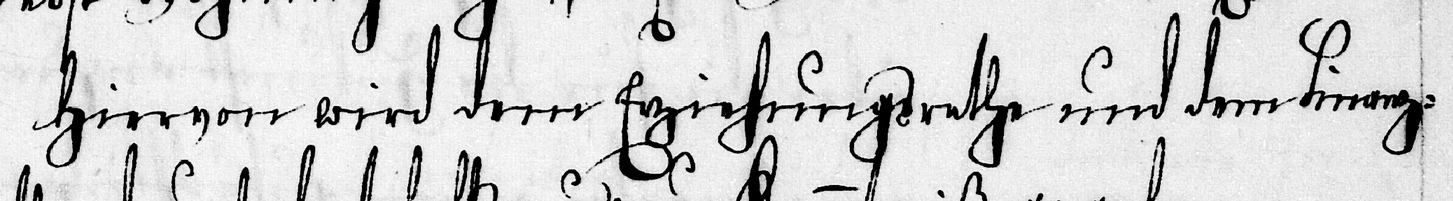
Hiervon wird dem Erziehungsrathe und dem Finanz¬
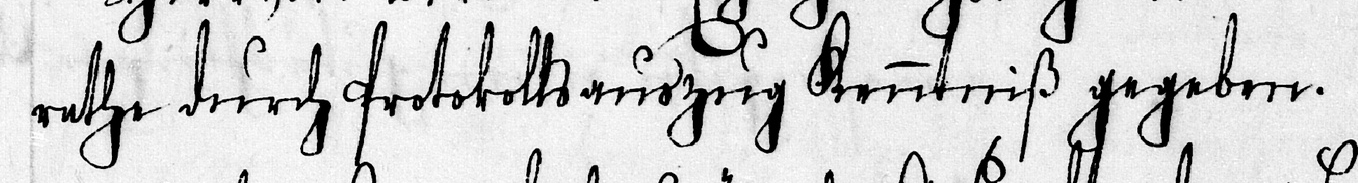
rathe durch Protokollsauszug Kenntniß gegeben.
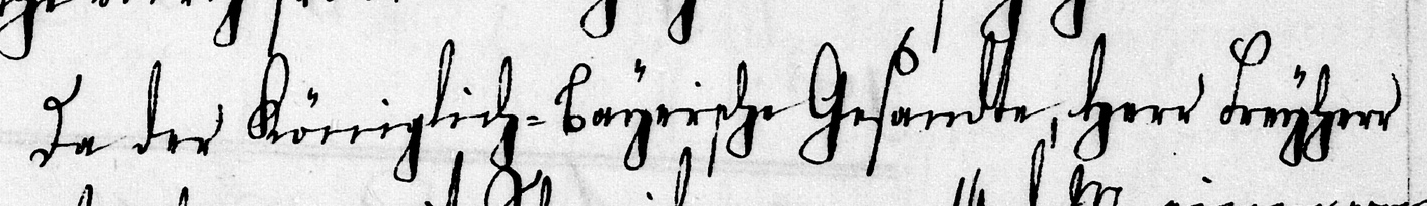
Da der Königlich-Bayerische Gesandte, Herr Freyherr
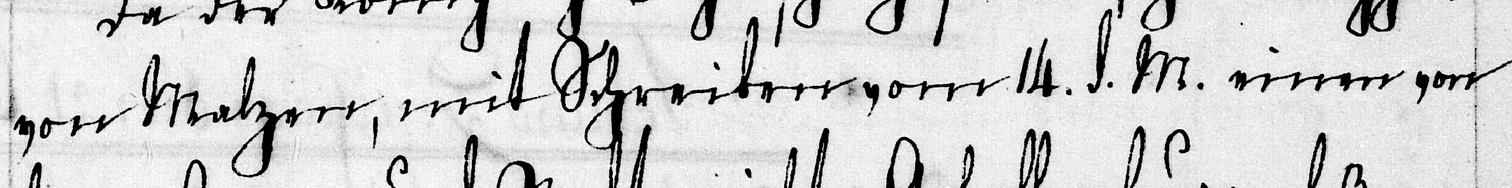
von Malzen, mit Schreiben vom 14. d. M. einen von
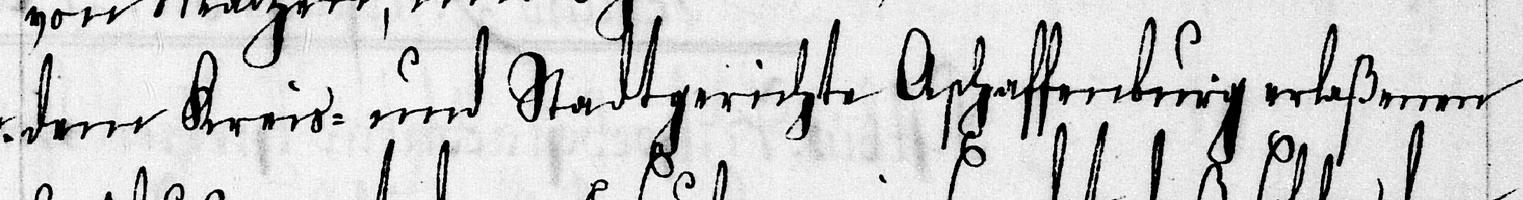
dem Kreis- und Stadtgerichte Aschaffenburg erlaßenen
